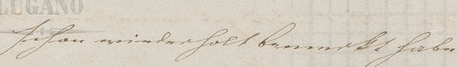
schon wiederholt bemerkt habe –
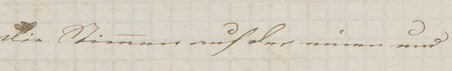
die Stimmen auf der einen und
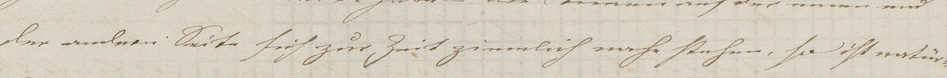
der andern Seite sich zur Zeit ziemlich nahe stehen, so ist natür-
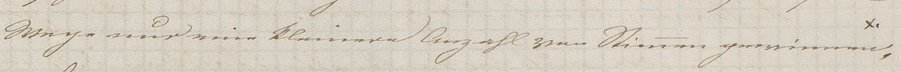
Wege nur eine kleinere Anzahl von Stimmen gewinnen.x
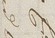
unter
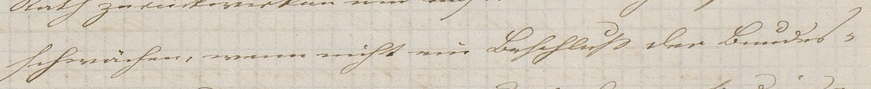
schwächen, wenn nicht ein Beschluß der Bundes-
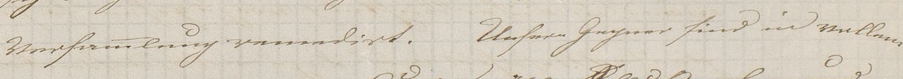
Versammlung remendirt. Unsere Gegner sind in vollem
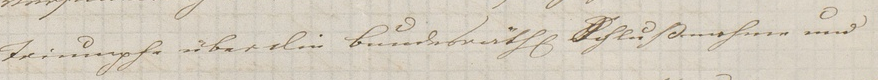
Triumphe über die Bundesräthliche Schlußnahme und
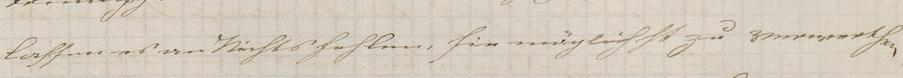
lassen es an Nichts fehlen, sie möglichst zu verwerthen.
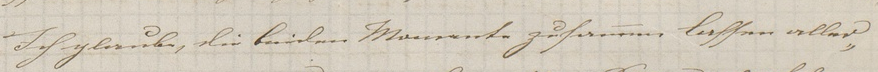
Ich glaube, die beiden Momente zusammen lassen aller-
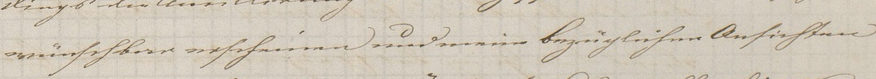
wünschbar erscheinen und meine bezüglichen Ansichten
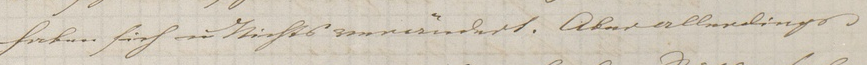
haben sich in Nichts verändert. Aber allerdings
